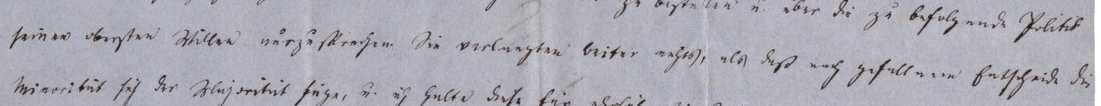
seinen obersten Willen auszusprechen. Sie verlangten weiter nichts, als daß nach gefallnem Entscheide die
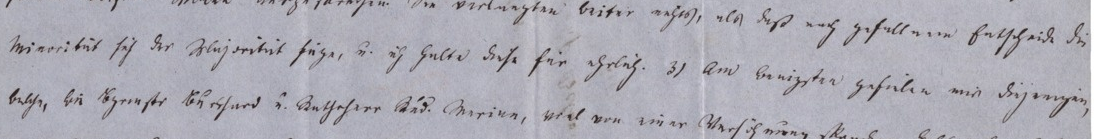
Minorität sich der Majorität füge, u. ich halte diese für ehrlich. 3) Am wenigsten gefielen mir diejenigen,
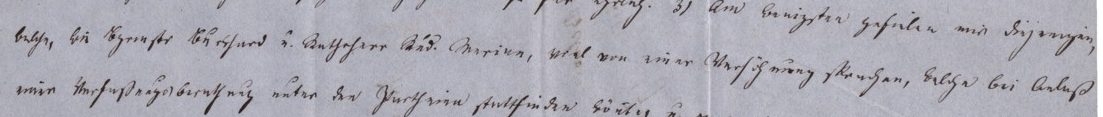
welche, wie Bgrmstr Burckhard u. Rathsherr Rud. Merian, viel von einer Versöhnung sprachen, welche bei Anlaß
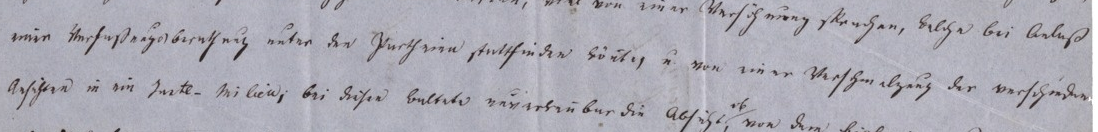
einer Verfassungsberathung unter den Partheien stattfinden könnte, u. von einer Verschmelzung der verschiednen
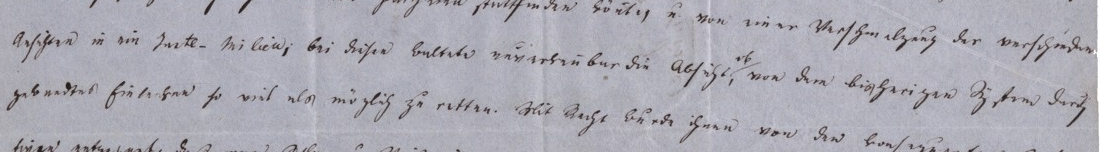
Ansichten in ein Juste-Milieu; bei diesen waltete unverkennbar die Absicht ob, von dem bisherigen System durch
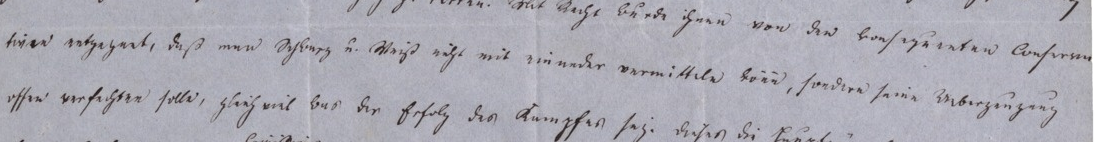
tiven entgegnet, daß man Schwarz u. Weiß nicht mit einander vermitteln könne, sondern seine Ueberzeugung
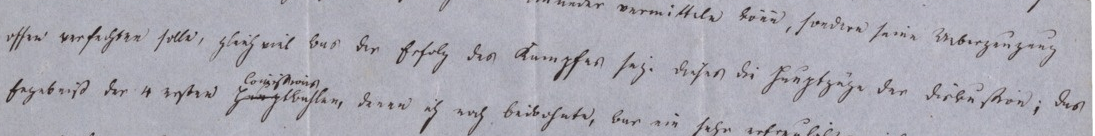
offen verfechten solle, gleichviel was der Erfolg des Kampfes sey. Dieses die Hauptzüge der Diskussion; das
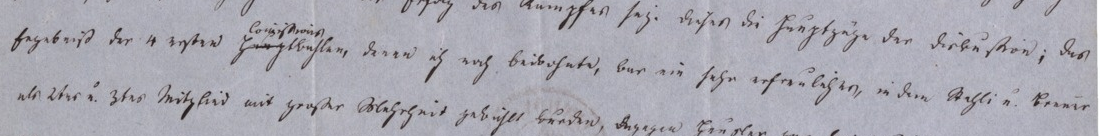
Ergebniß der 4 ersten HauptComissionswahlen, denen ich noch beiwohnte, war ein sehr erfreuliches, in dem Stehli u. Brenner
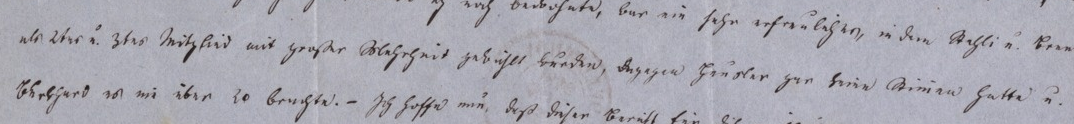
als 2tes u. 3tes Mitglied mit großer Mehrheit gewählt wurden, dagegen Heusler gar keine Stimmen hatte u.
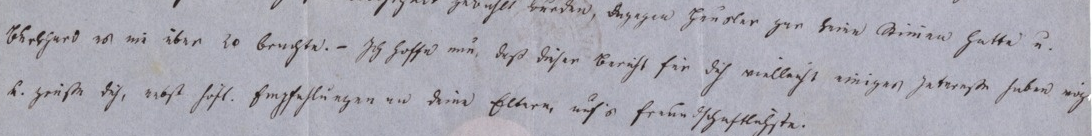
Burckhard es nie über 20 brachte. – Ich hoffe nun, daß dieser Bericht für dich vielleicht einiges Interesse haben möge
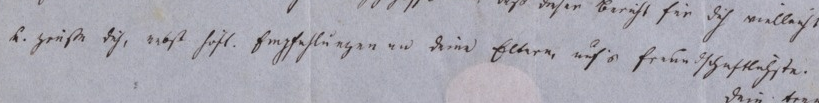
u. grüße dich, nebst höfl. Empfehlungen an deine Eltern, auf's freundschaftlichste.
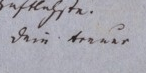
Dein treuer
